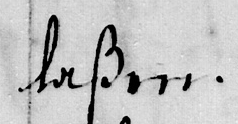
laßen.
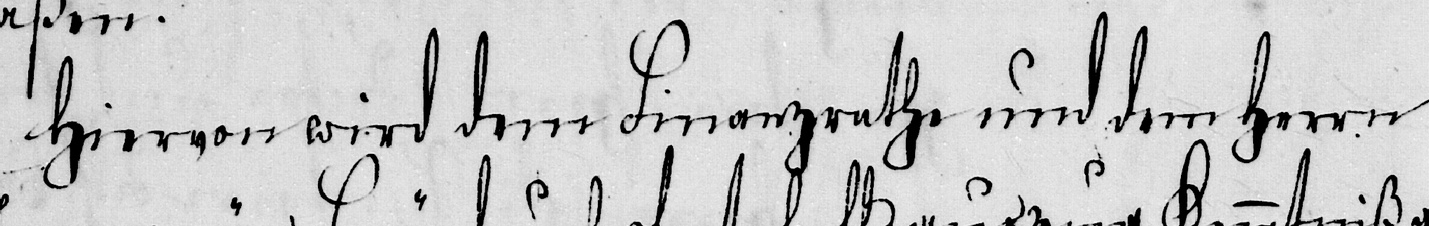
Hiervon wird dem Finanzrathe zur Vollziehung
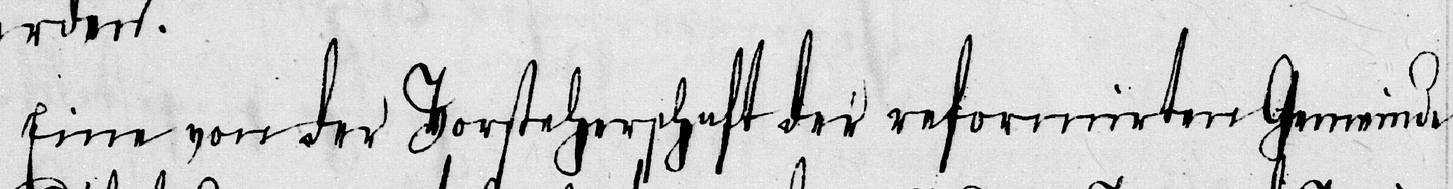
Eine von der Vorsteherschaft der reformierten Gemeinde
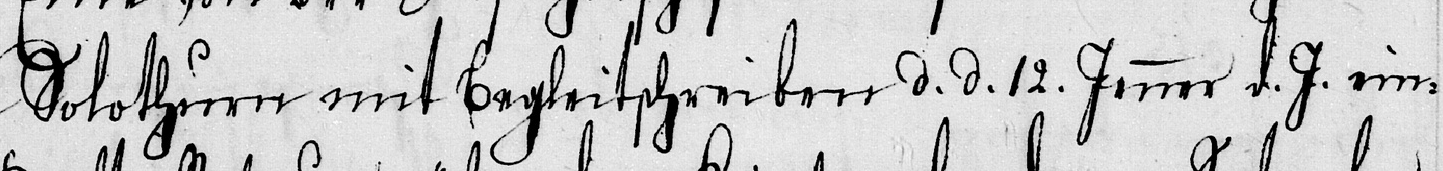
Solothurn mit Begleitschreiben d. d. 12. Jenner d. J. ein¬
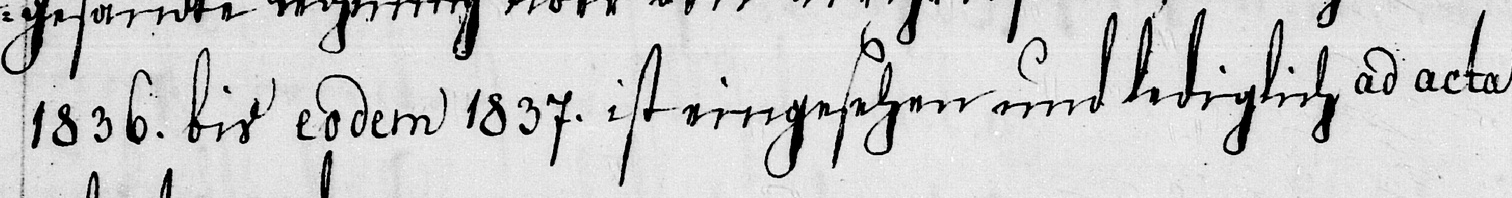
1836. bis eodem 1837. ist eingesehen und lediglich ad acta
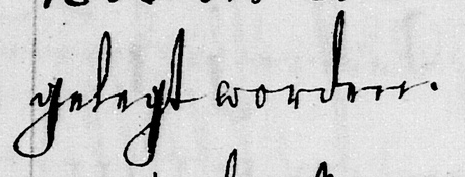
gelegt worden.
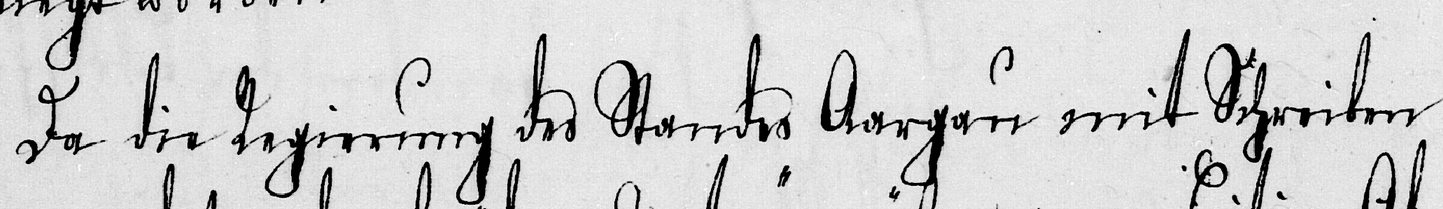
Da die Regierung des Standes Aargau mit Schreiben
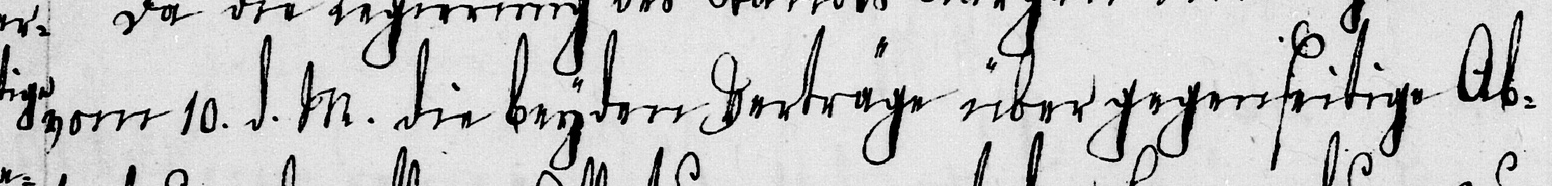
vom 10. d. M. die beyden Verträge über gegenseitige Ab¬
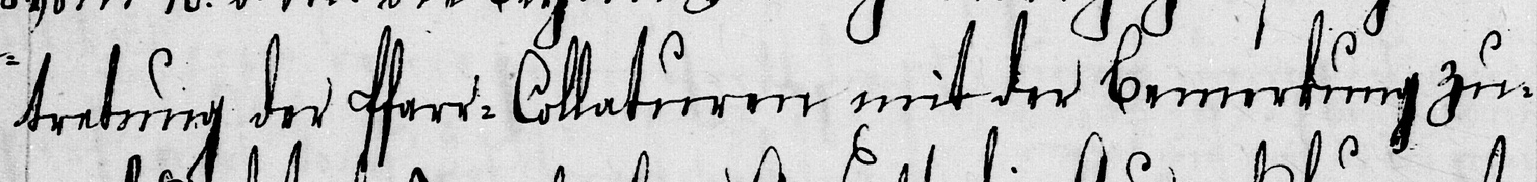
tretung der Pfarr-Collaturen mit der Bemerkung zu¬
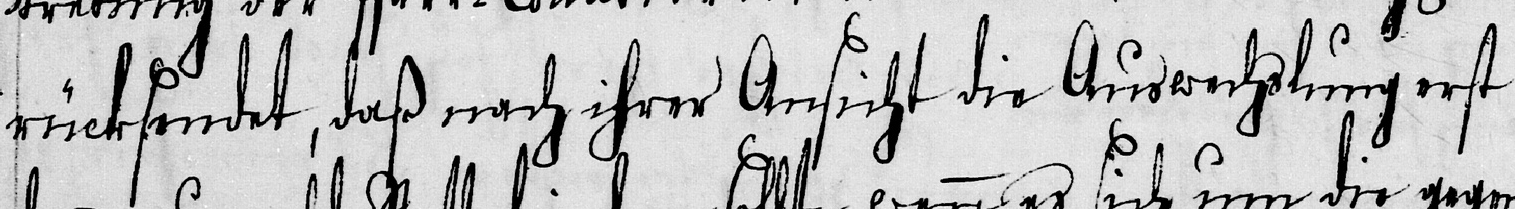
rücksendet, daß nach ihrer Ansicht die Auswechslung erst
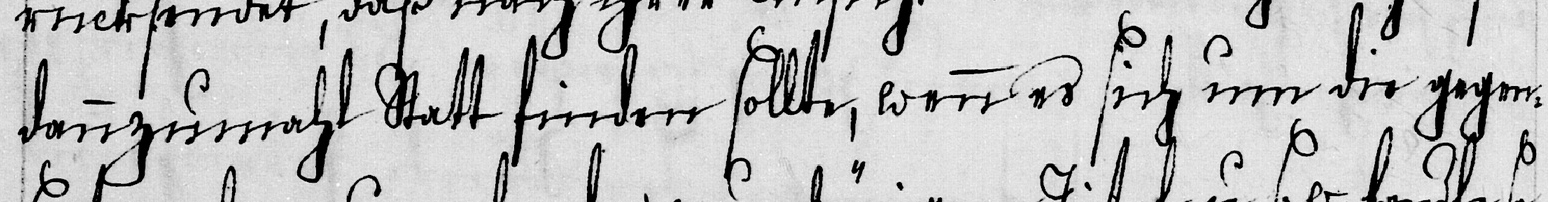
dannzumahl Statt finden sollte, wenn es sich um die gegen¬
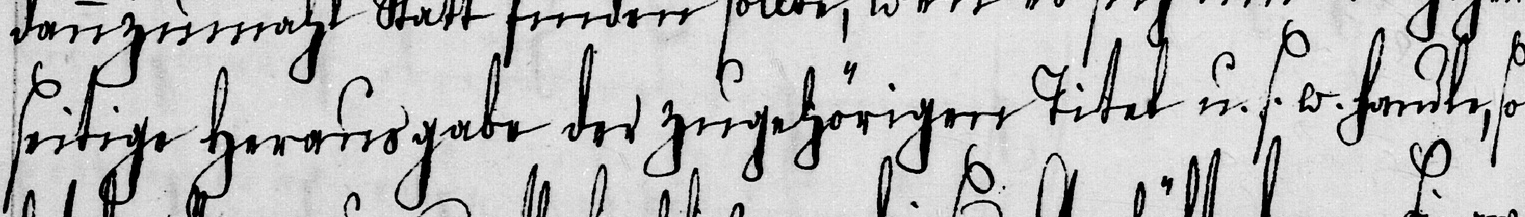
seitige Herausgabe der zugehörigen Titel u.s.w. handle,
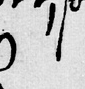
M.
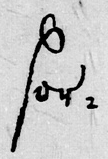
san¬
